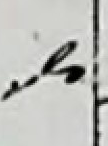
do
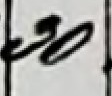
30
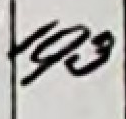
193
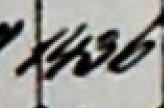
1436
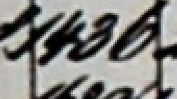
1436
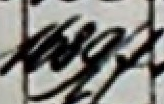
1689/f
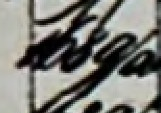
1689/a
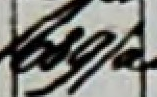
1689/a
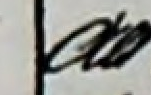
Alt
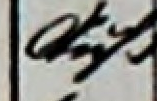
Aus„
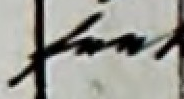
see
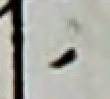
„
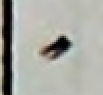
„
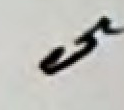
5
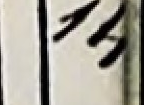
14
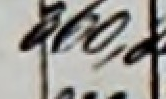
360,0
